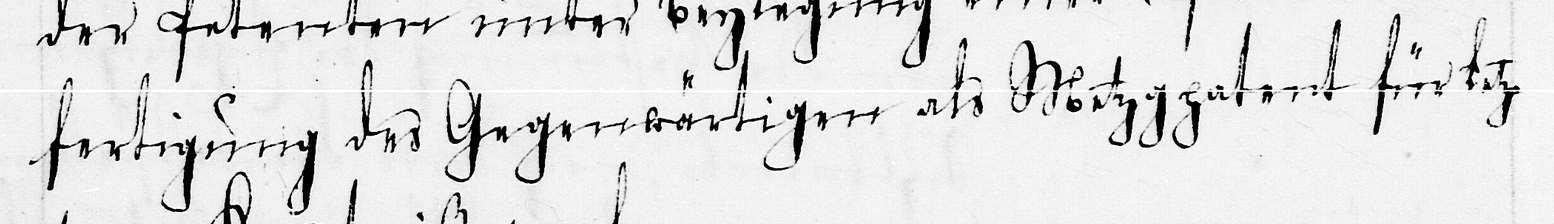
fertigung des Gegenwärtigen als Metzgpatent für Let¬
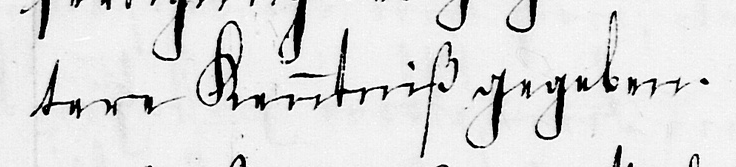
ztere Kenntniß gegeben.
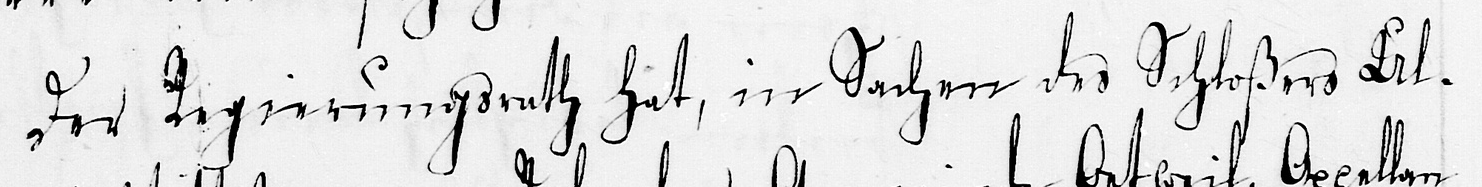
Der Regierungsrath hat, in Sachen des Schloßers Ul¬
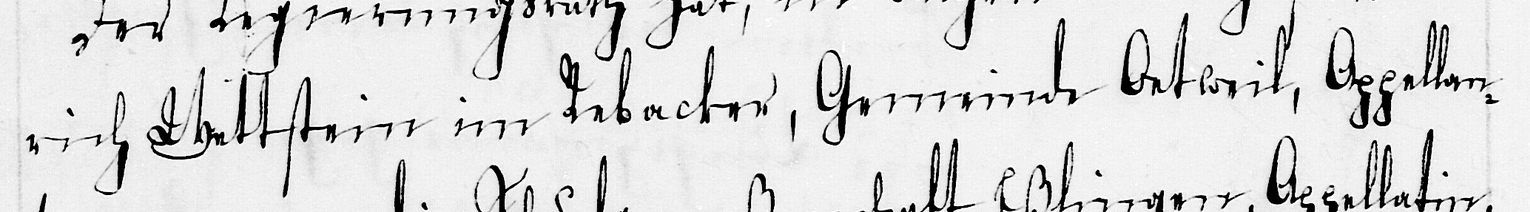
rich Wettstein im Rebacker, Gemeinde Oetweil, Appella¬
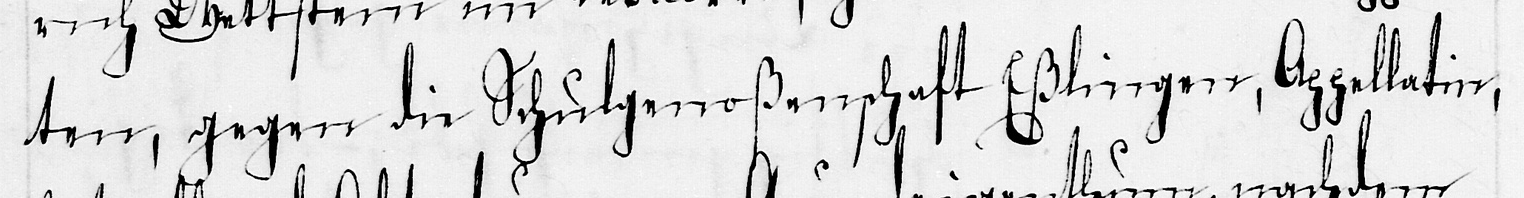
nten, gegen die Schulgenoßenschaft Eßlingen, Appellatin,
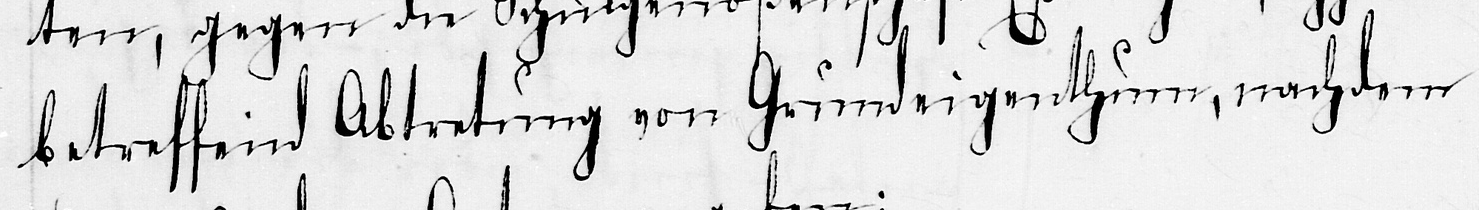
betreffend Abtretung von Grundeigenthum, nachdem
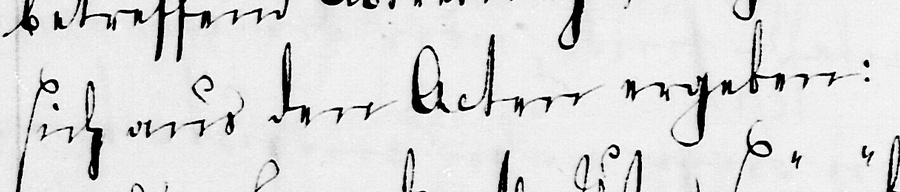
sich aus den Acten ergeben:
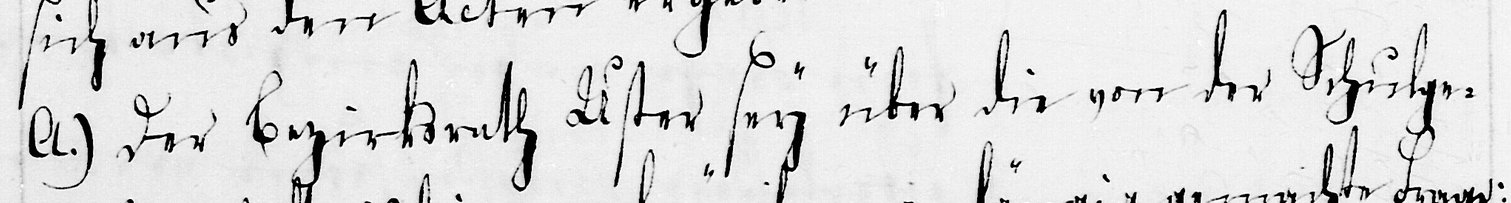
A.) Der Bezirksrath Uster sey über die von der Schulge¬
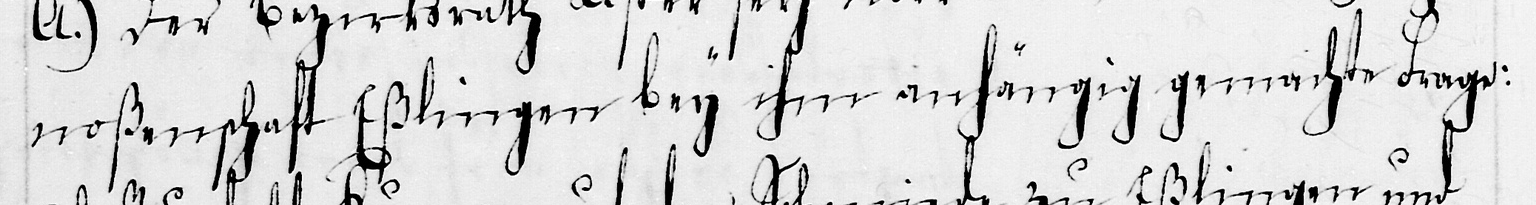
noßenschaft Eßlingen bey ihm anhängig gemachte Frage:
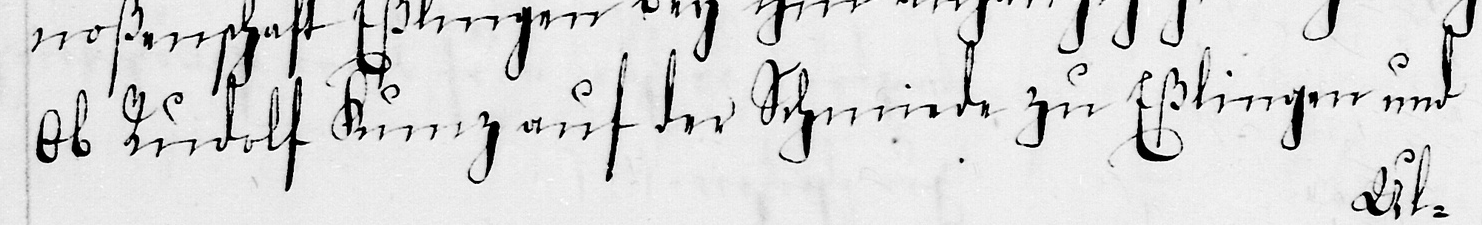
Ob Rudolf Kunz auf der Schmiede zu Eßlingen und
